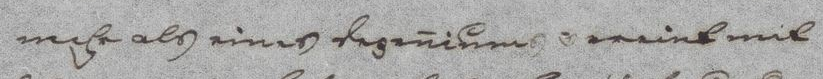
mehr als eines Dezenniums vereint mit
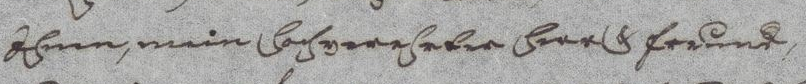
Ihnen, mein hochverehrter Herr & Freund,
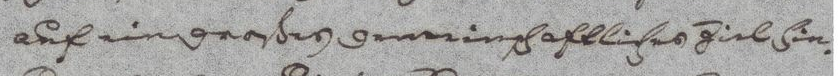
auf ein großes gemeinschaftliches Ziel hin-
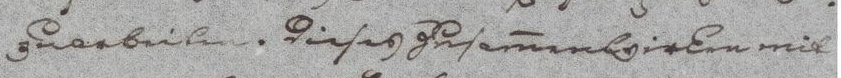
zuarbeiten. Dieses Zusammenwirken mit
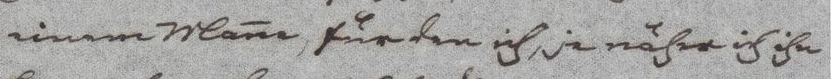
einem Manne, für den ich, je näher ich ihn
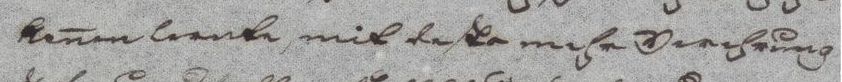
kennen lernte, mit desto mehr Verehrung
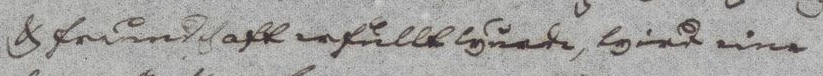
& Freundschaft erfüllt wurde, wird eine
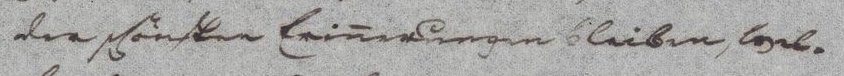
der schönsten Erinnerungen bleiben, wel-
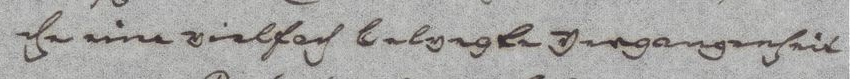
che eine vielfach bewegte Vergangenheit
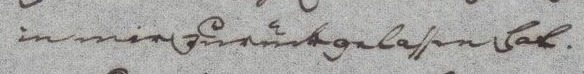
in mir zurückgelassen hat.
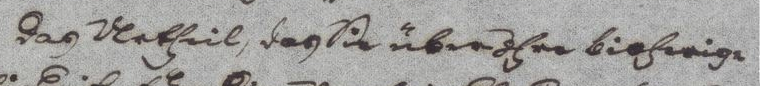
Das Urtheil, das Sie über Ihre bisherige
